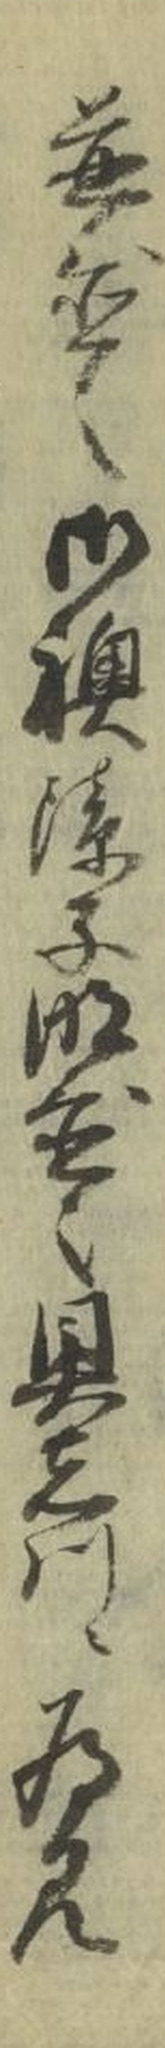並置之御襖障子明置之具志川に為見
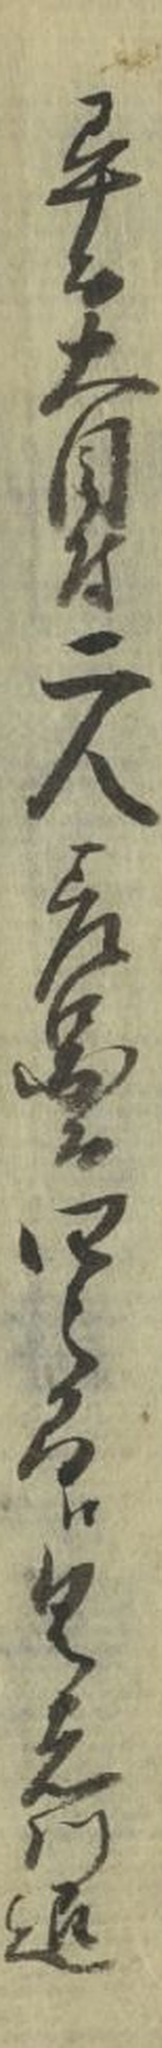畢て大目付二人差図而四之間え具志川退
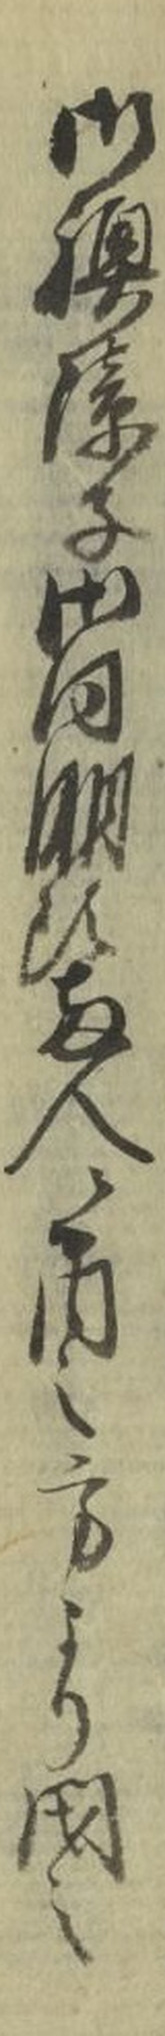御襖障子御同朋頭両人にて内之方より閉之
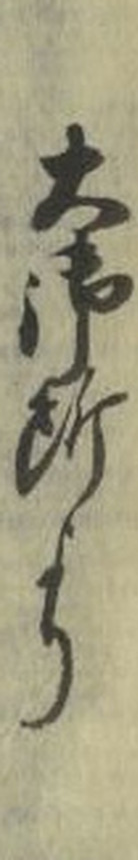大御所より
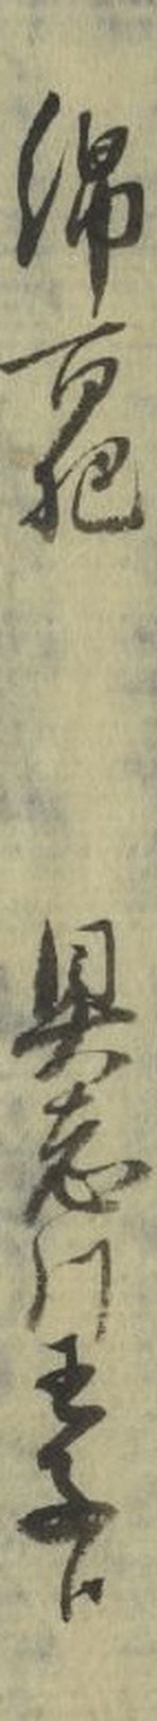綿百把具志川王子え
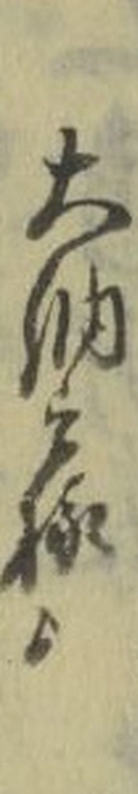大納言様ゟ
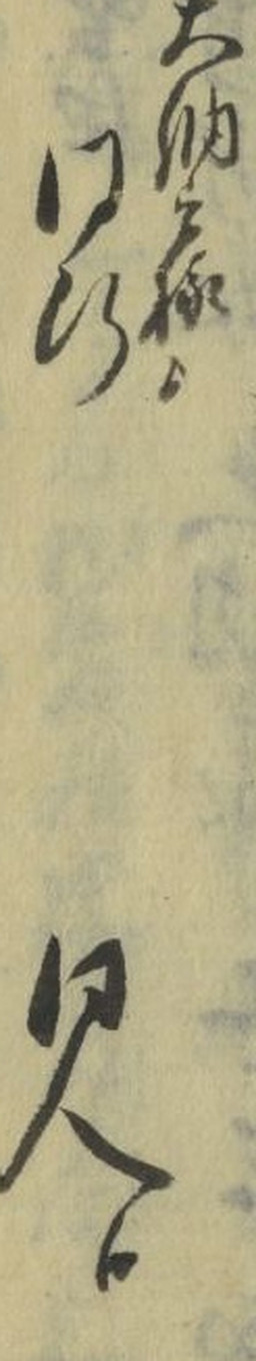同断同人え
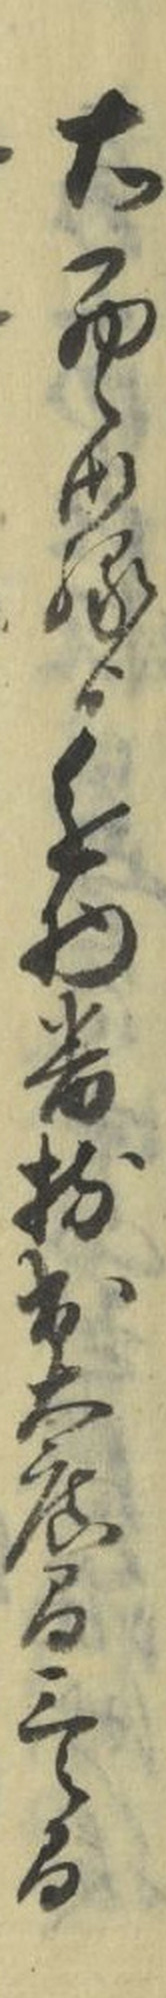右西之御縁ゟ進物番持出大広間三之間
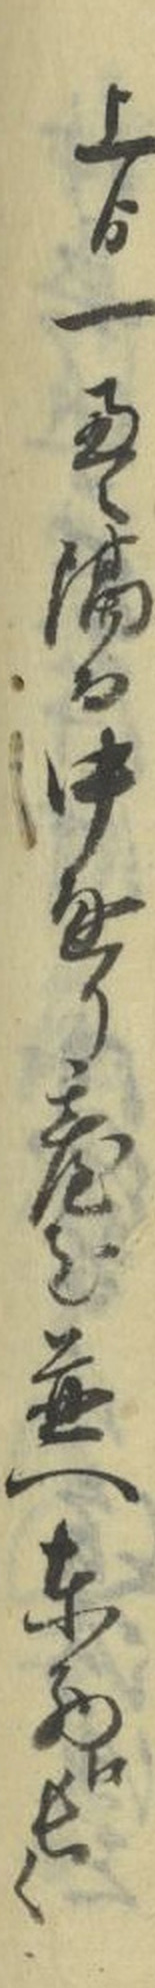上ゟ一畳隔て中通り台を並へ東西え長く
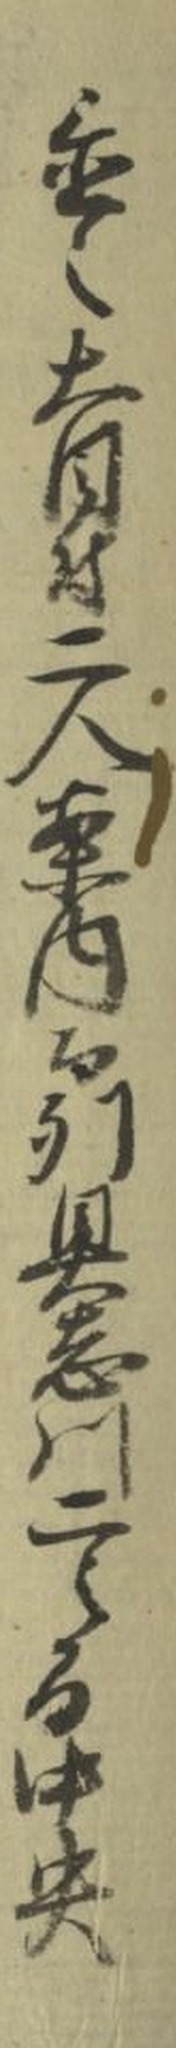置之大目付二人案内而列具志川二之間中央
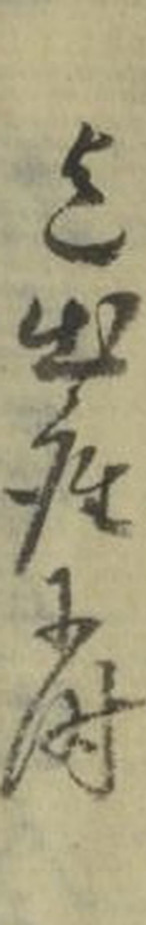迄出座于時
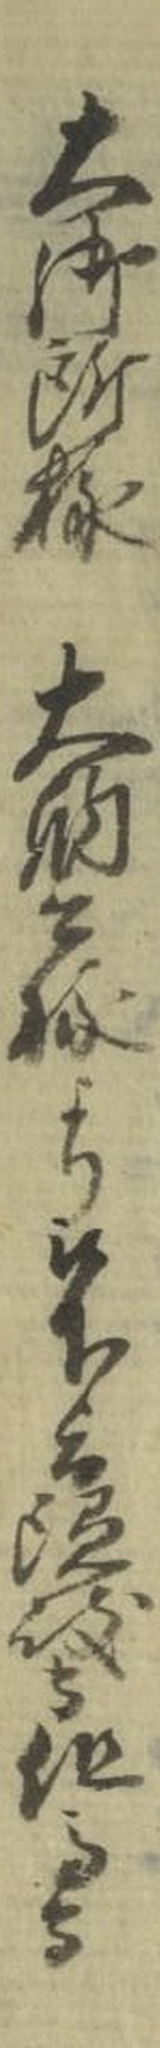大御所様大納言様より被下旨隠岐守但馬守
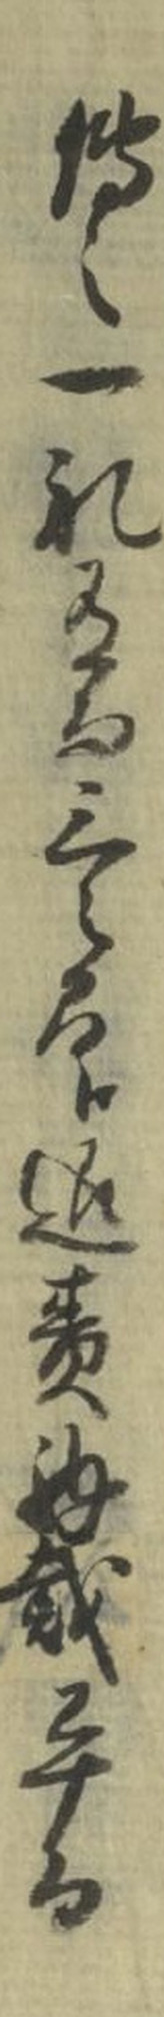伝之一礼有て三之間え退賚拝戴畢て
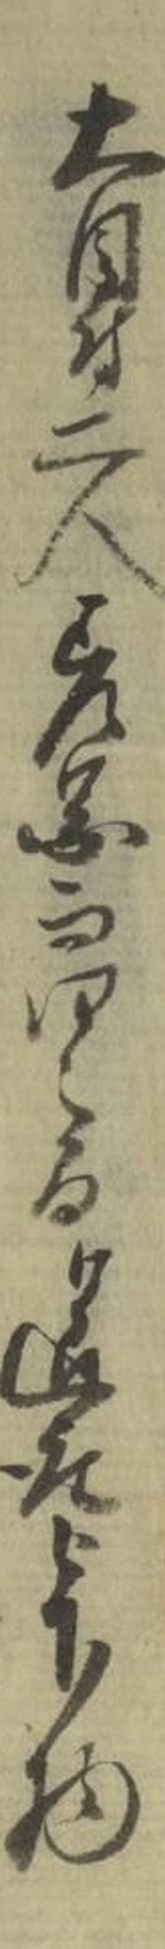大目付二人差図而四之間え退座被下物
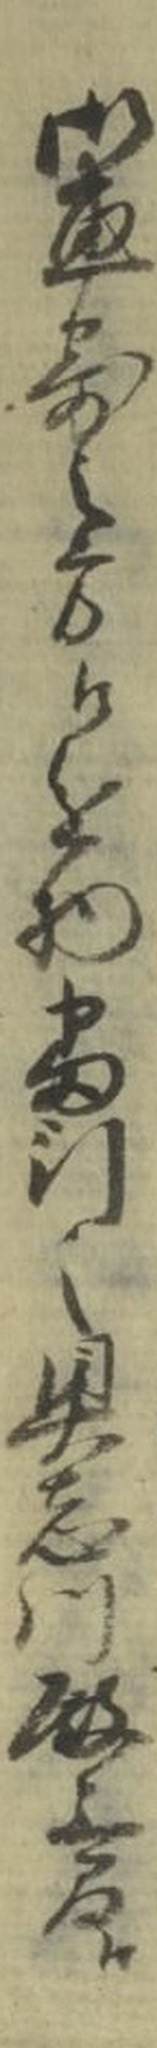御車寄之方え進物番引之具志川殿上間え
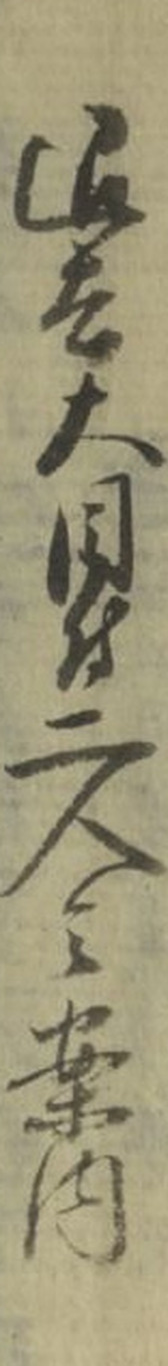退去大目付二人にて案内
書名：戊辰琉球人来朝之式 全
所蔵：University of the Ryukyus Library
